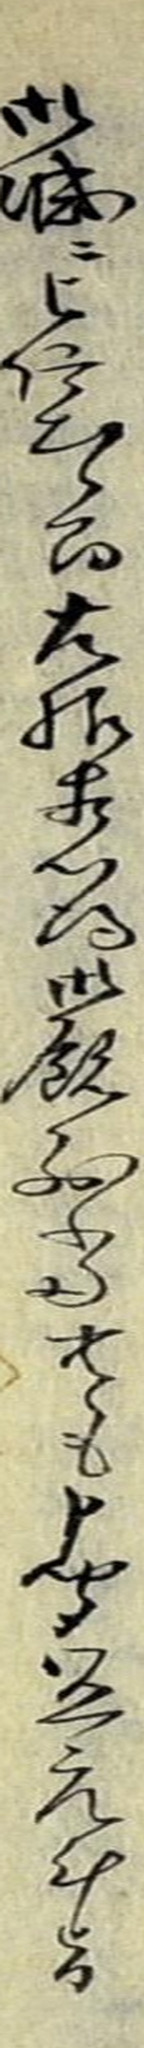御減に被仰出候間左様相心得御厩別当共へも申聞宜取斗旨
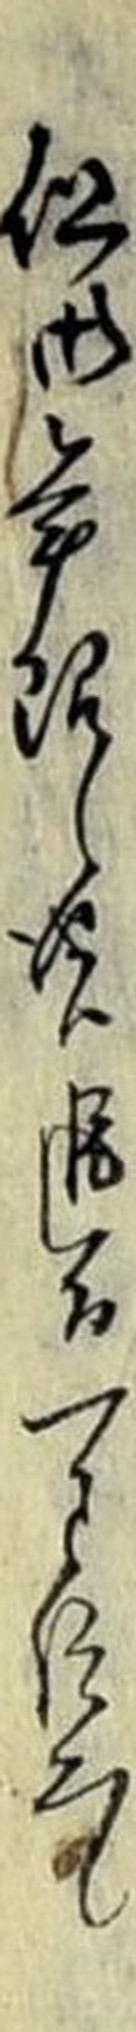但御年限之儀は追而可被仰出候
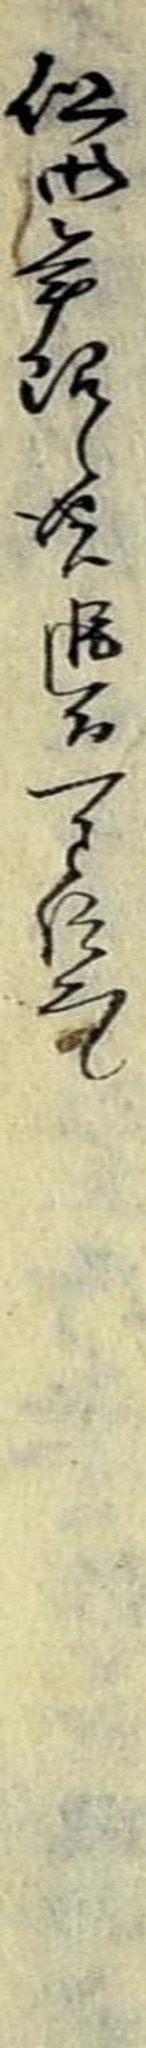但御年限之儀は追而可被仰出候
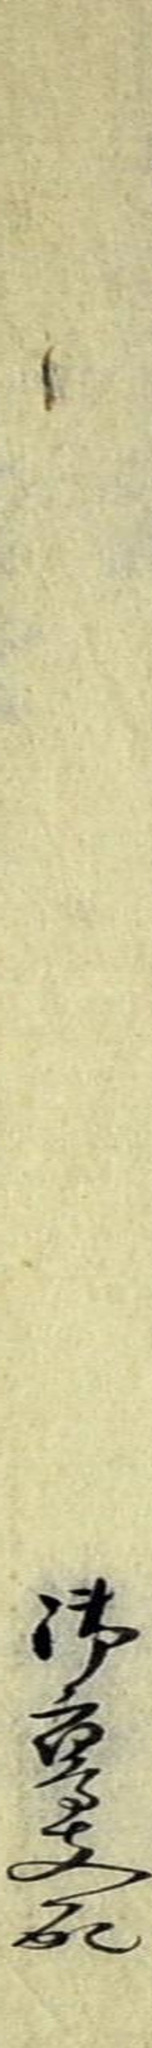御鷹支配
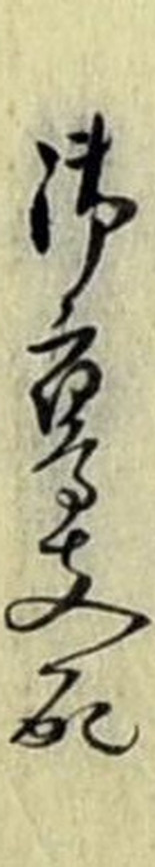御鷹支配
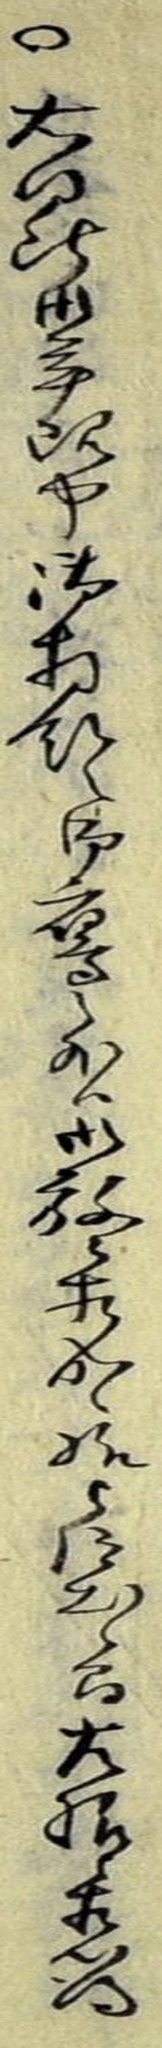○右同断御年限中御拝領之御鷹之外は御放に相成候様被仰出候間左様相心得

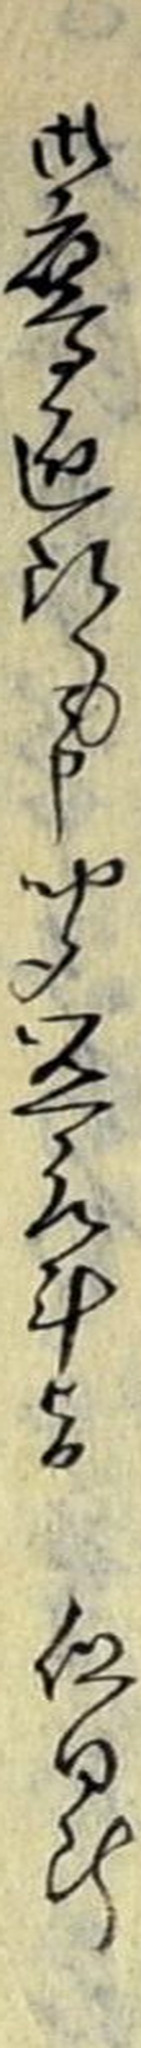御鷹匠頭へも申聞宜取斗旨但同断
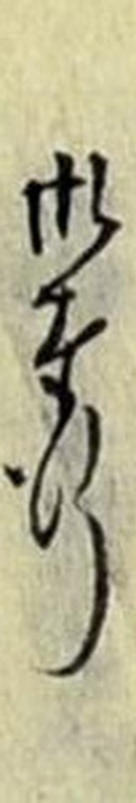御奉行
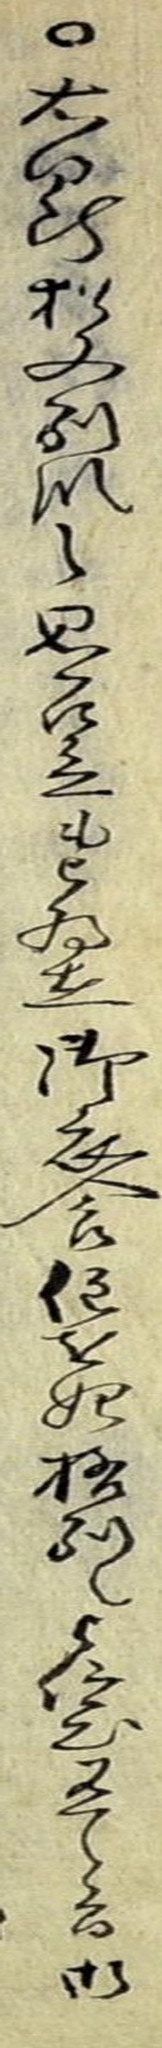○右同断猶又別段之思召立も被為在御衣食住を始格別之被仰出有之候間御
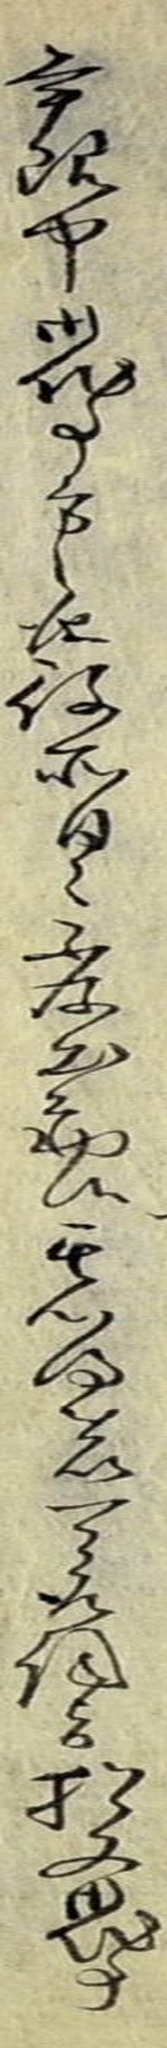年限中御作事方之儀役所日々不及出勤候其心得を以可被取調旨猶又御作事
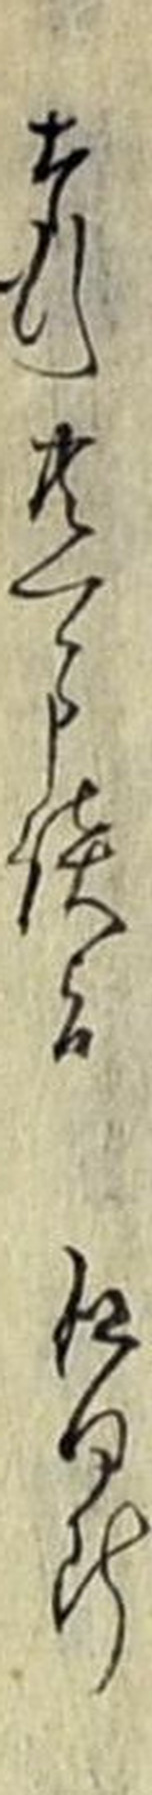奉行共可申談旨但同断
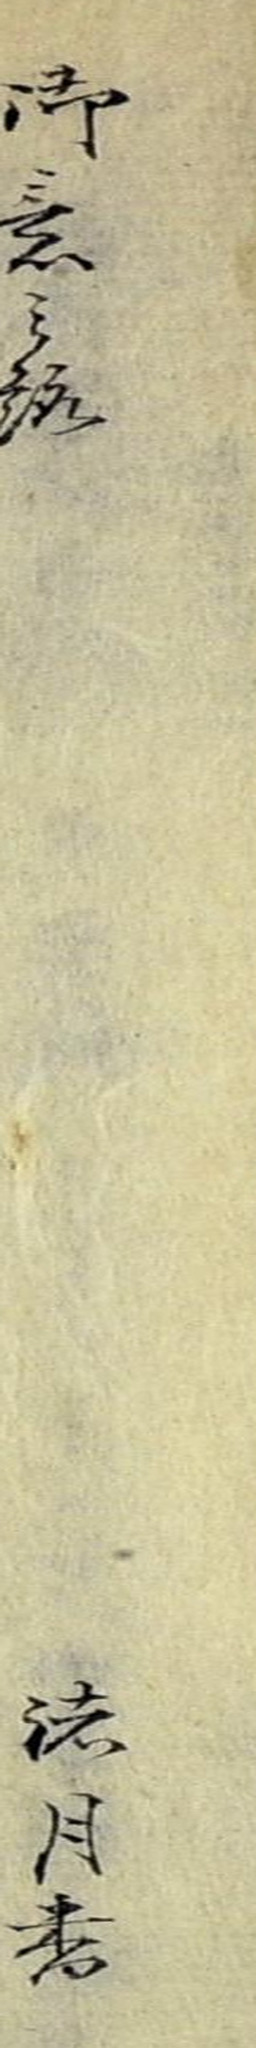御意之趣諸月番
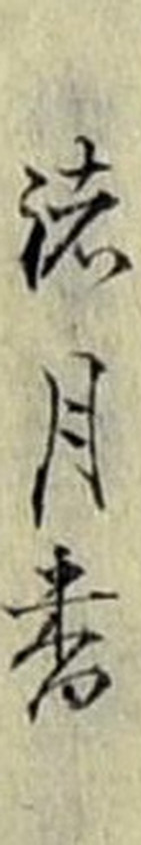諸月番
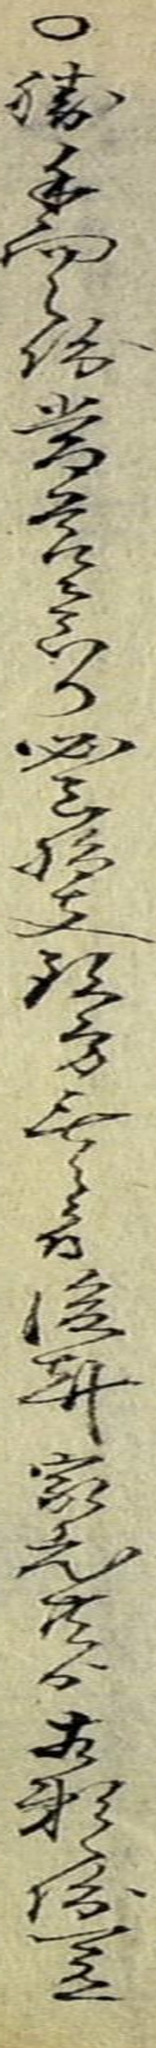○勝手向之儀当節に至り必至指支致方無之に付後刻家老共ゟ御頼候儀可有
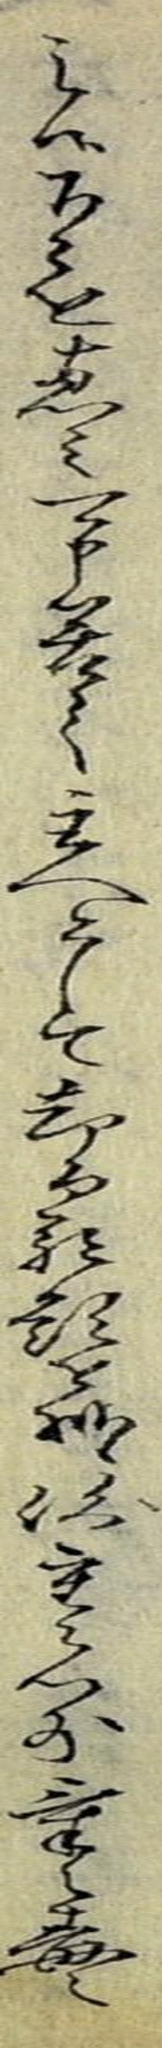之候下々を恵み可申筈之主人として却而難題を掛候儀重々心外気之毒之
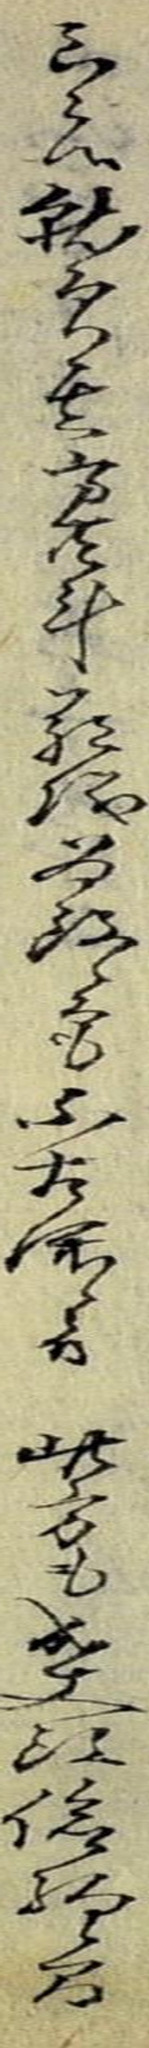至に候就而は其方共難儀為致候而も不相済候に付此方も成丈致倹約候間
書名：命令之部 六
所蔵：福井県文書館 Fukui Prefectural Archives
